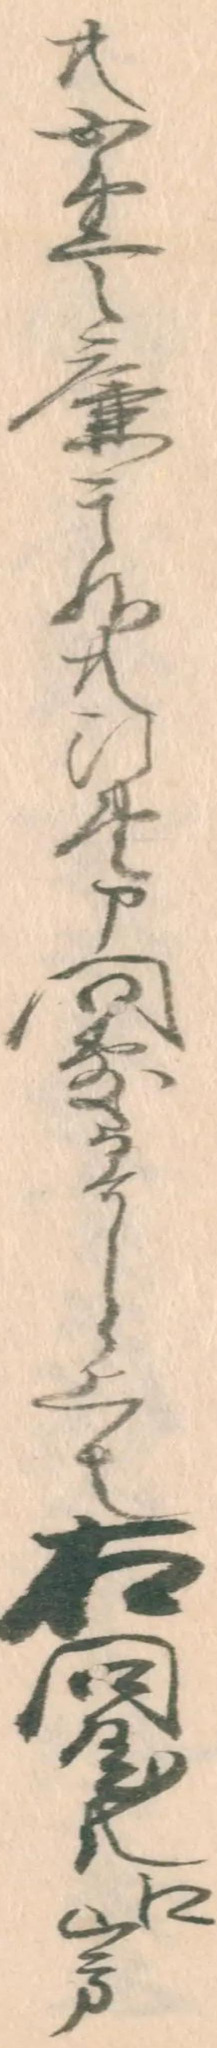共出金之廉其外共行届申間敷と有之候上は右問屋共え山方
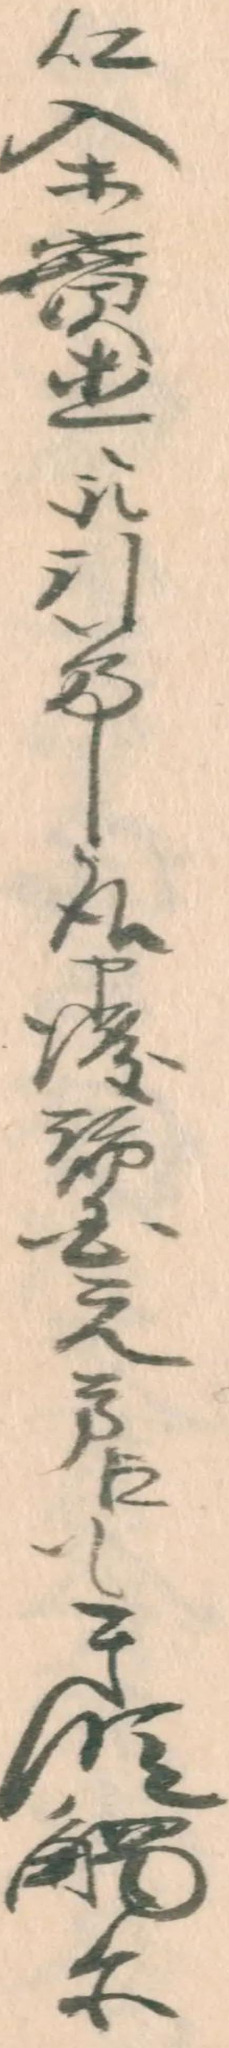仕入等実直之取引いたし候様申渡諸国元方えも其段触等
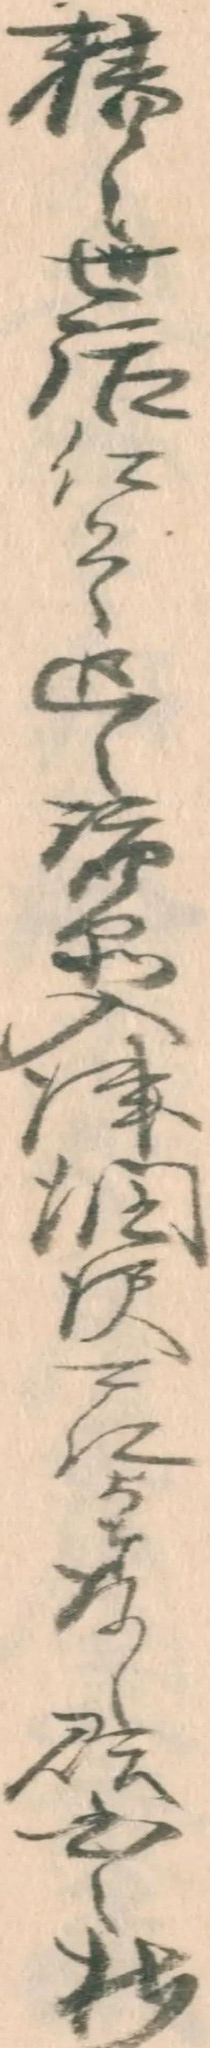精〻世話仕候ハヽ追〻諸品入津潤沢可仕と奉存候諸国の材
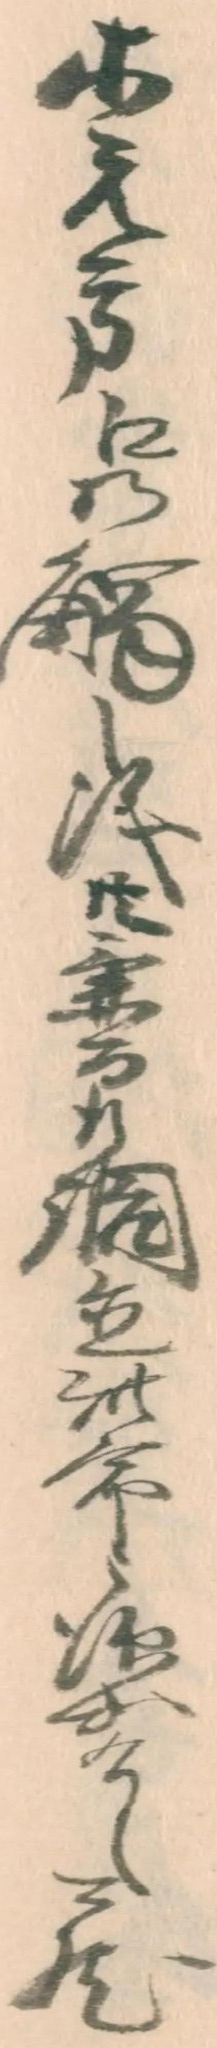木元方え御触之儀共兼て取調置此節被仰出有之可然
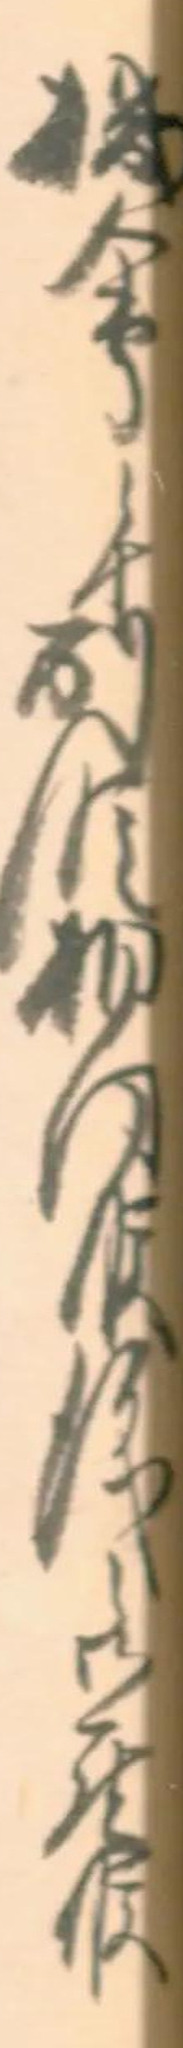機会ニ付別段相伺候儀ニ御座候
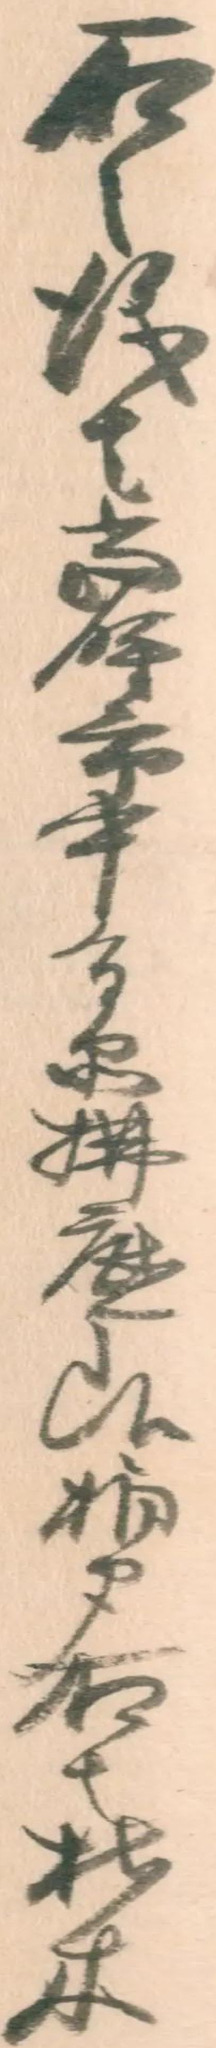一石之儀は当時市中有品払底之様ニ相聞右は材木
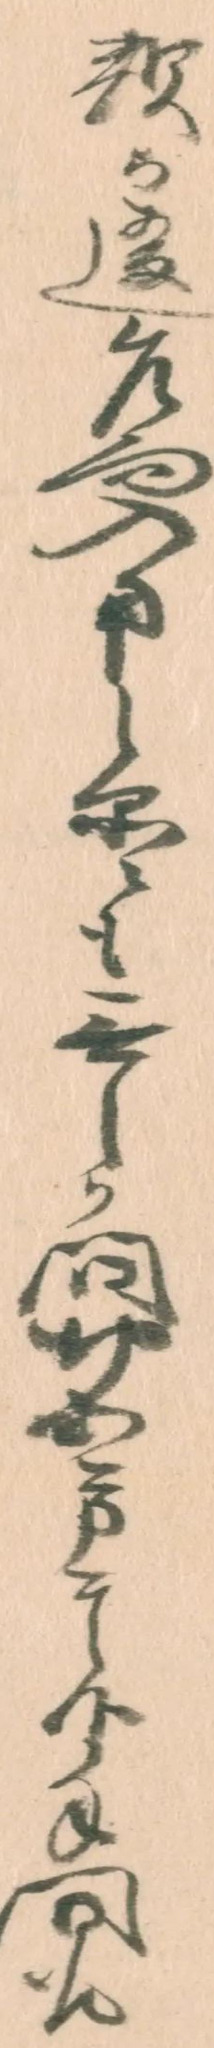類と違差向入用之品ニも無之候間地面方其外手間取
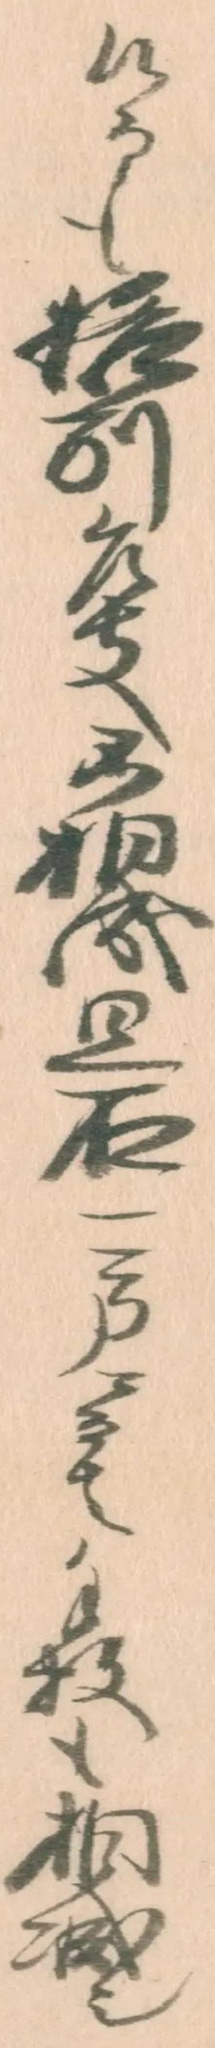候ても格別差支不相成且石一方ニては手数も相減シ
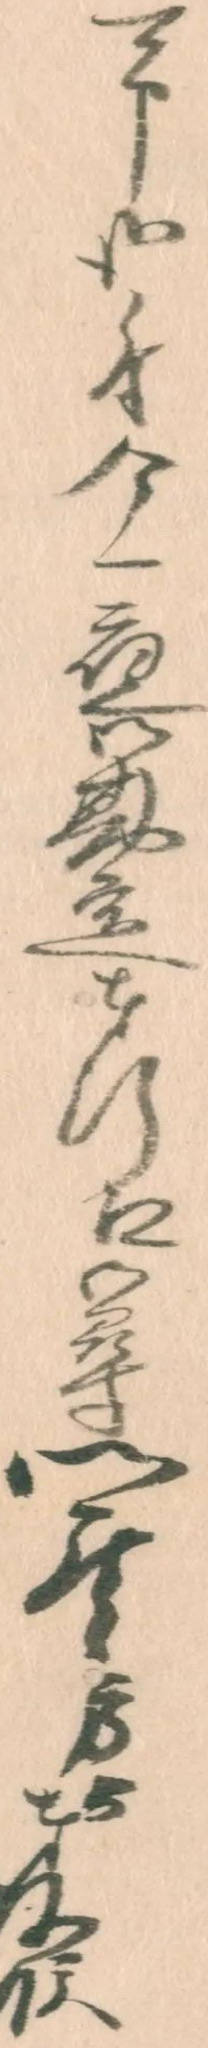可申哉ニ付今一応御勘定奉行え御尋御座候方奉存候
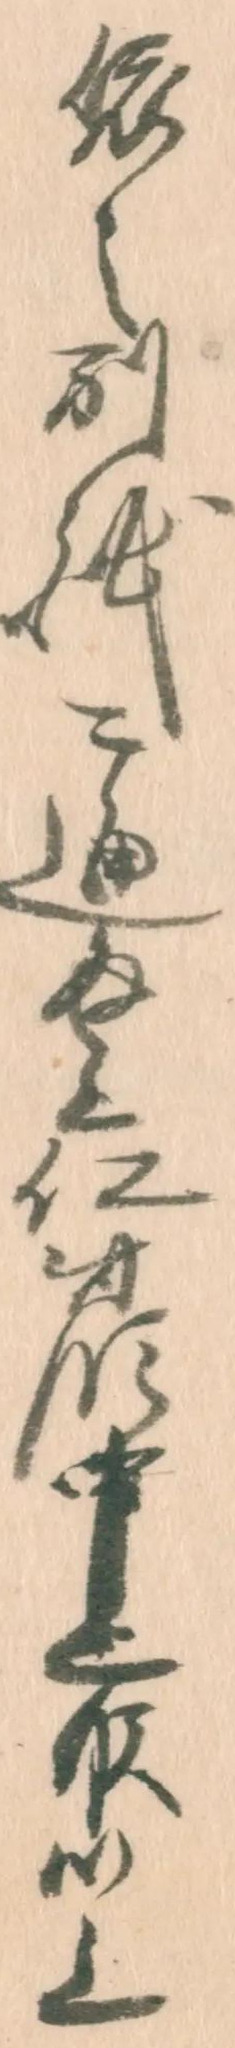依之別紙二通返上仕此段申上候以上
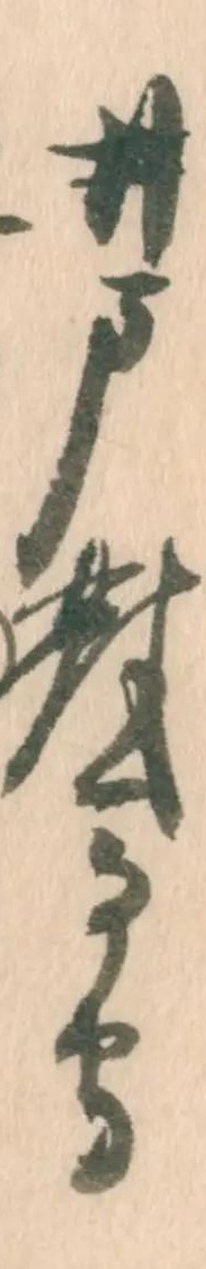卯井戸対馬守

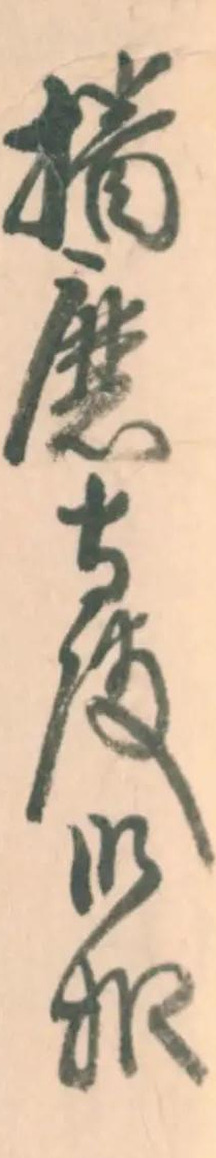「播磨守殿御扣」
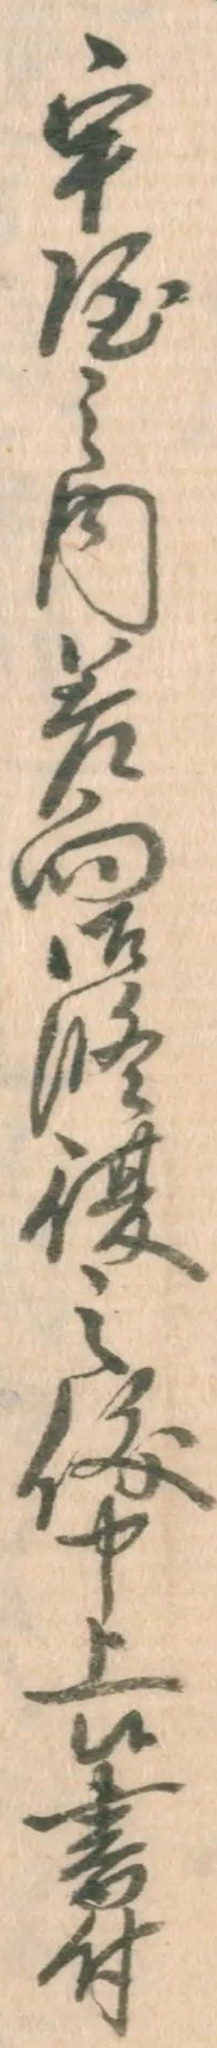│牢屋之内差向御修復之儀申上候書付
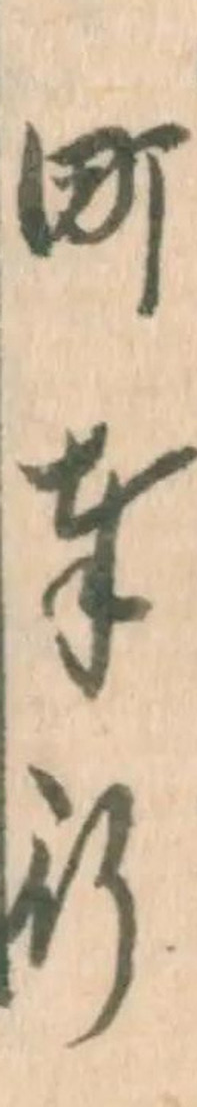│町奉行
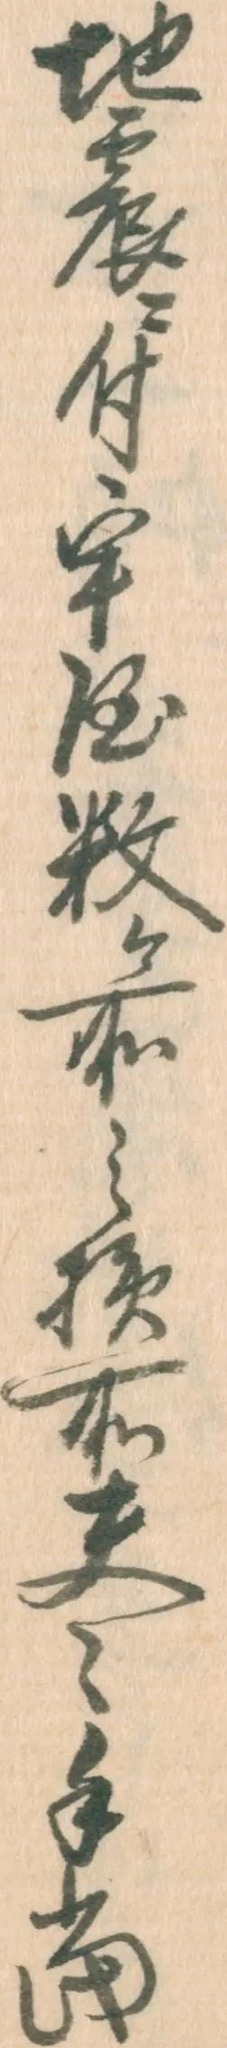地震ニ付牢屋数ケ所之損所夫〻手当
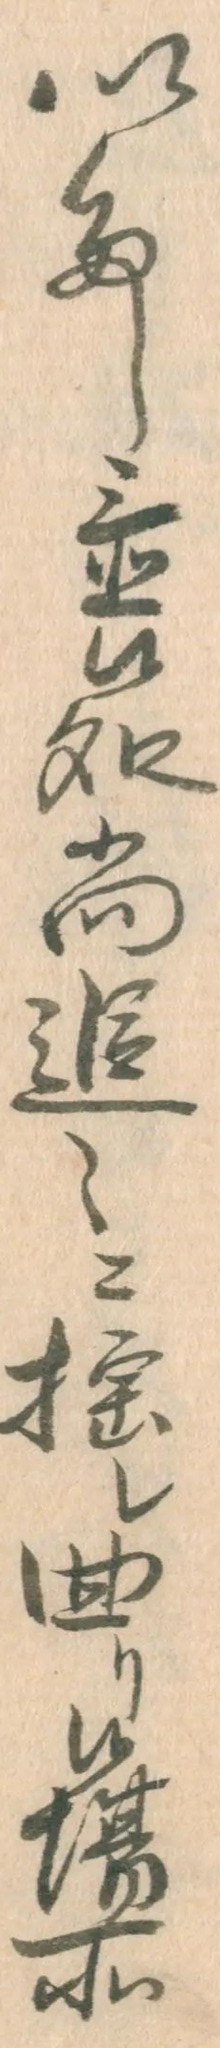いたし置候処尚追〻ニ揺れ曲り候場所
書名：地震災書留 2巻. [2] 内表紙に「地震一件　安政二卯年十月」とあり
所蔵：国立国会図書館 National Diet Library, JAPAN
